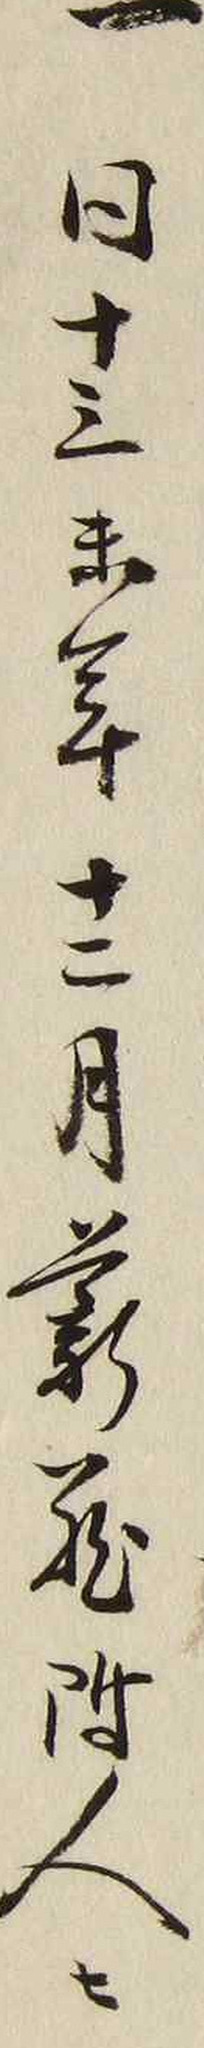一同十三未年十二月薪蔵附人被
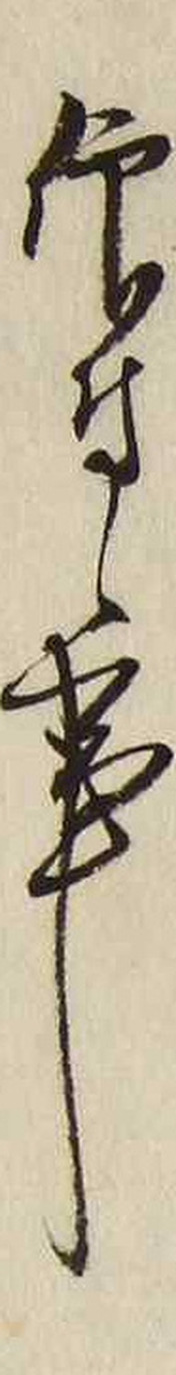仰付候事

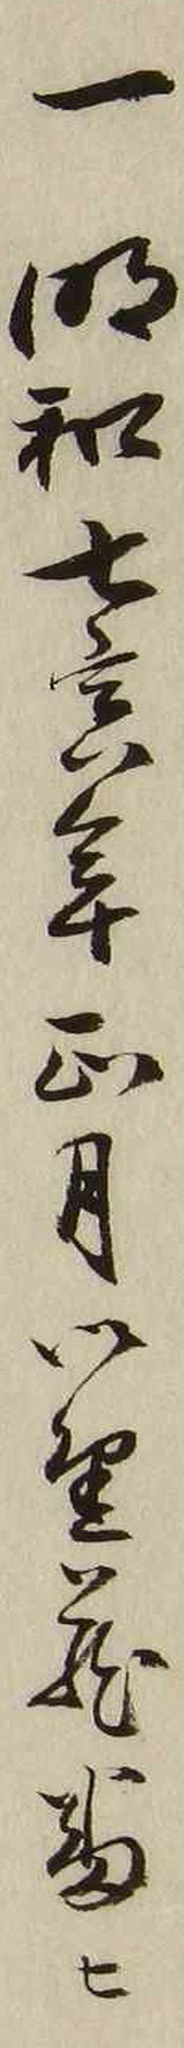一明和七寅年正月御金蔵番被
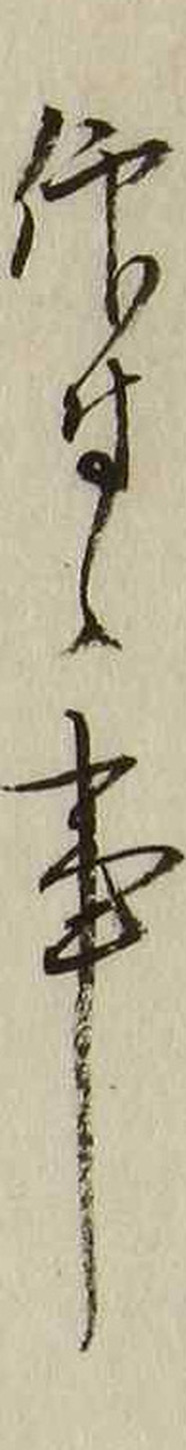仰付候事
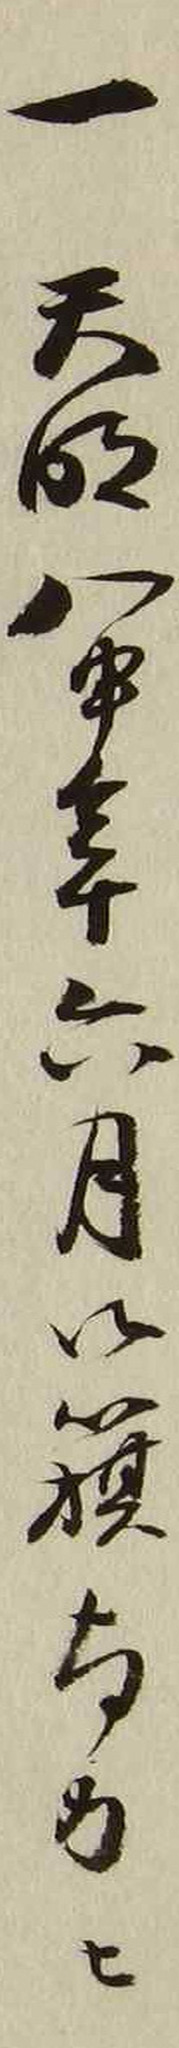一天明八申年六月御旗与力被
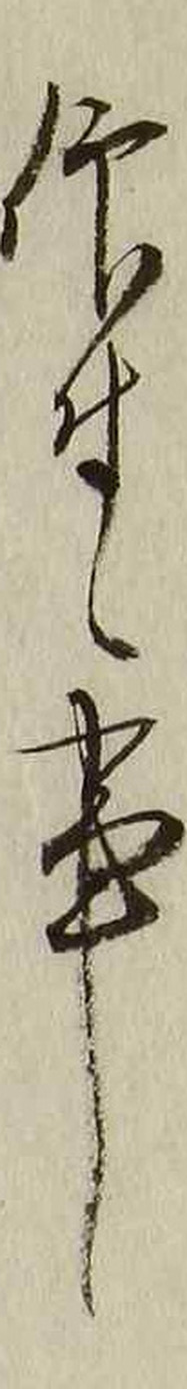仰付候事
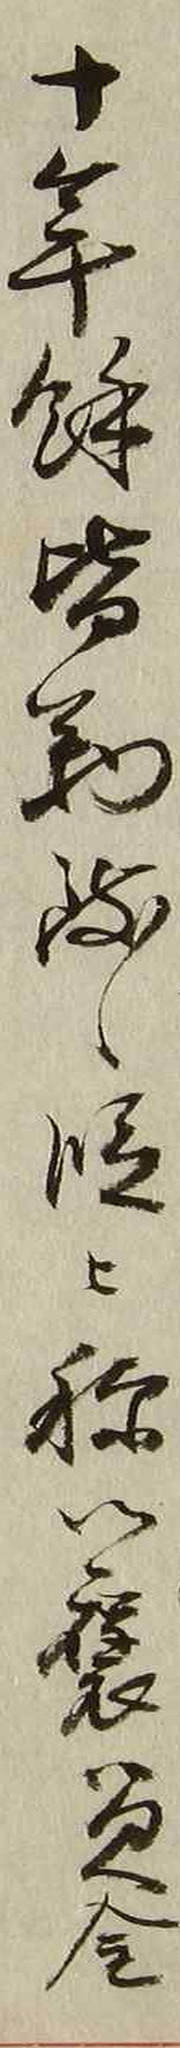十年余皆勤致候段被称御褒美金
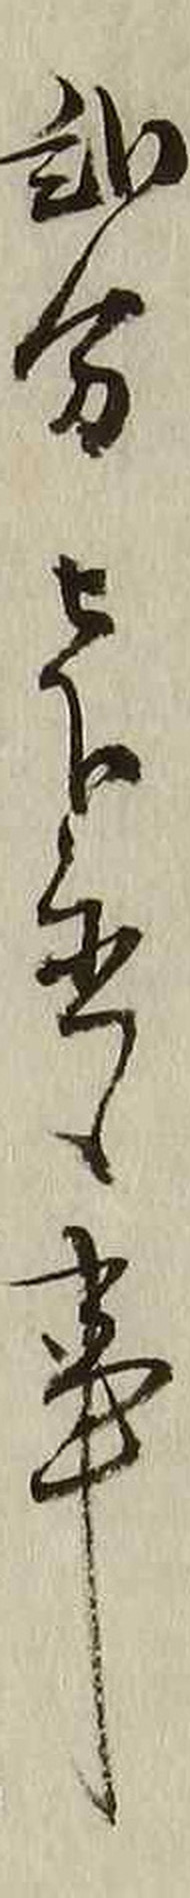弐分被下置候事
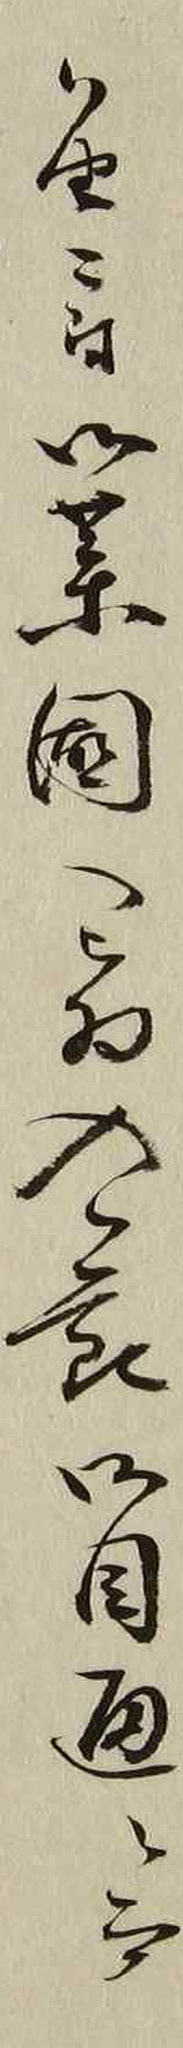候由ニ付御薬園へ被為入候節御目通ニ而
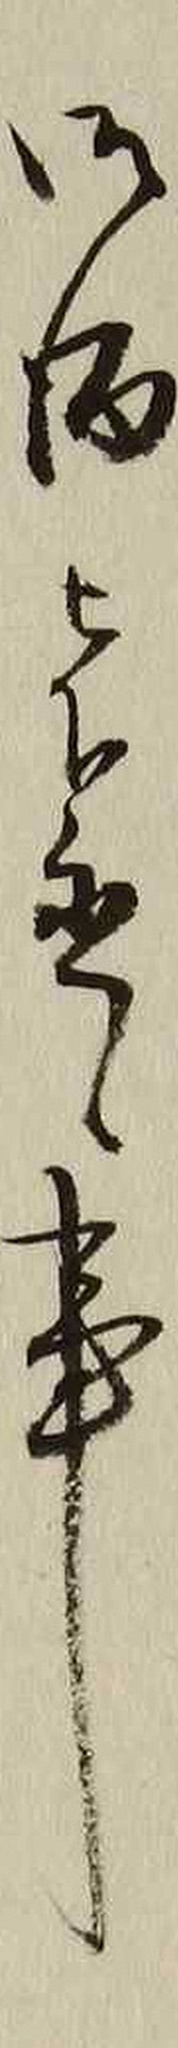御酒被下置候事
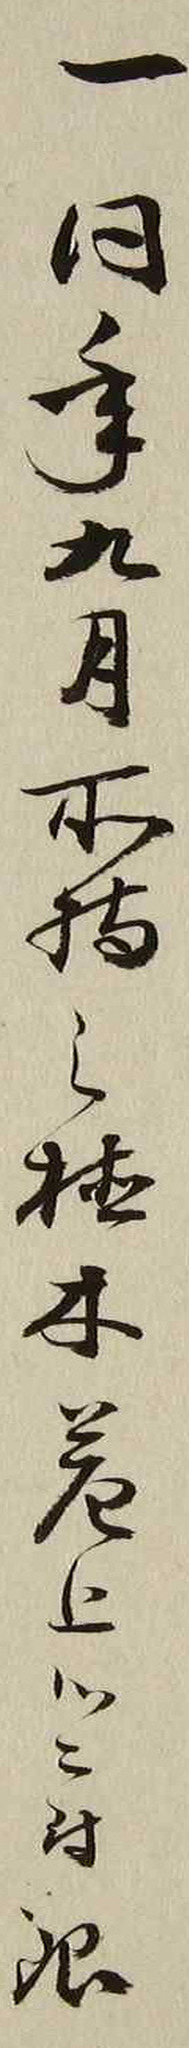一同年九月所持之植木差上候ニ付銀
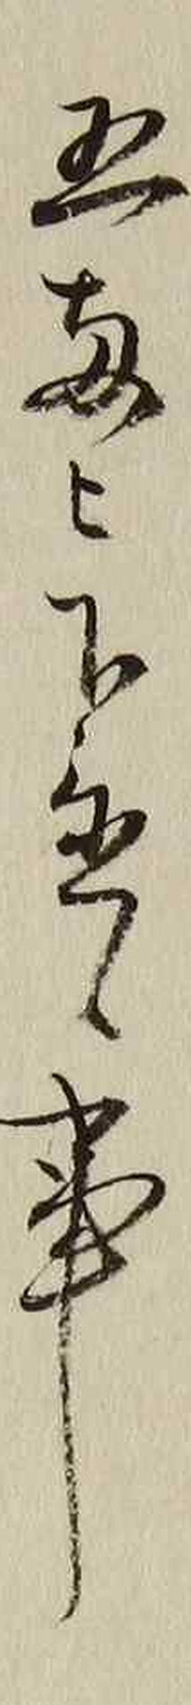五両被下置候事
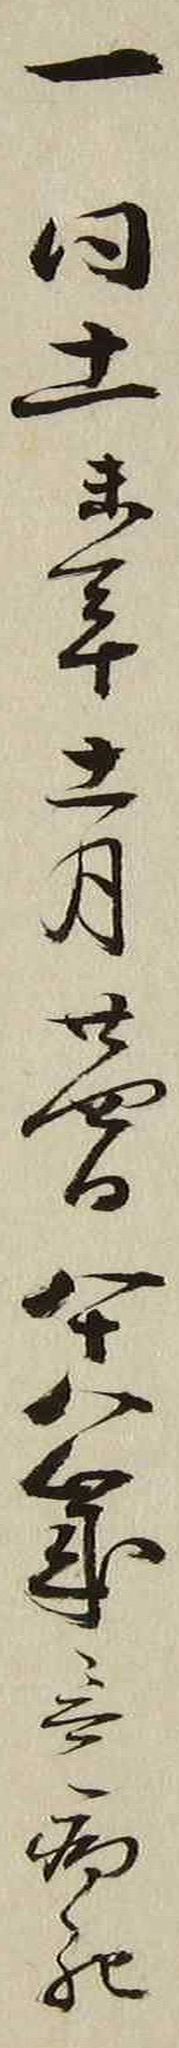一同十一未年十一月廿四日八十八歳ニ而病死
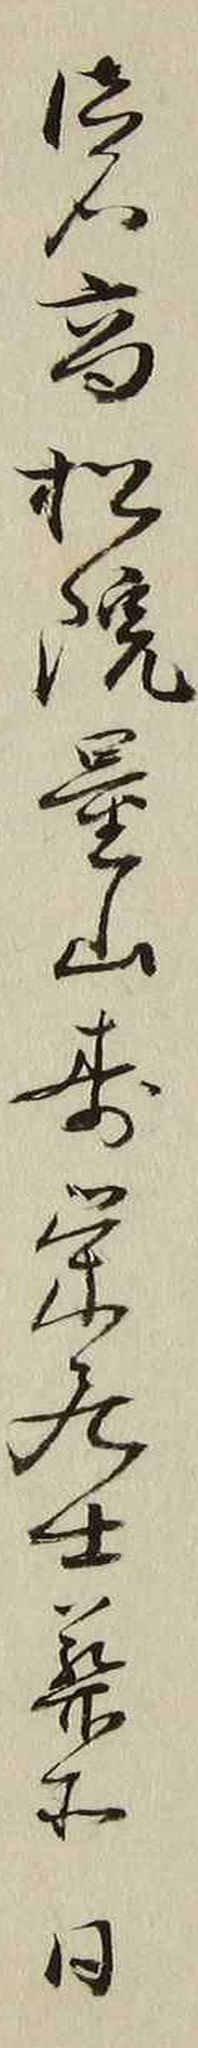法名高松院量山寿栄居士葬所同
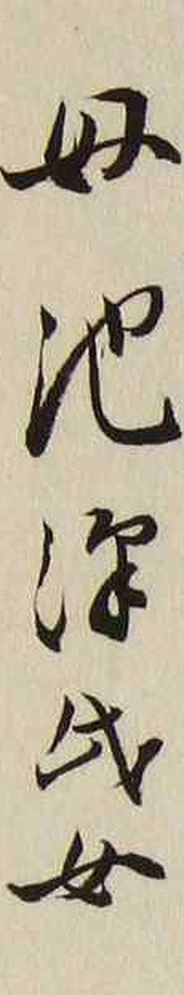母池沢氏女

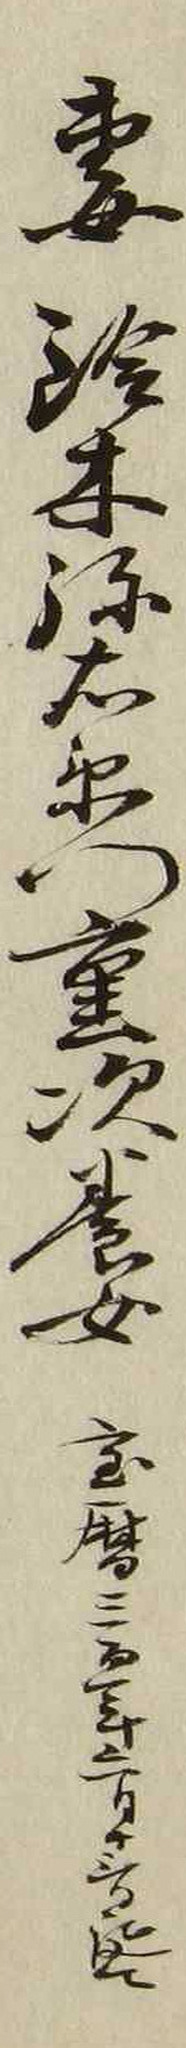妻鈴木弥右衛門重次養女宝暦三酉年六月十三日誕生
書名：諸士系譜　巻之291　さ之部23
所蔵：会津若松市立会津図書館
